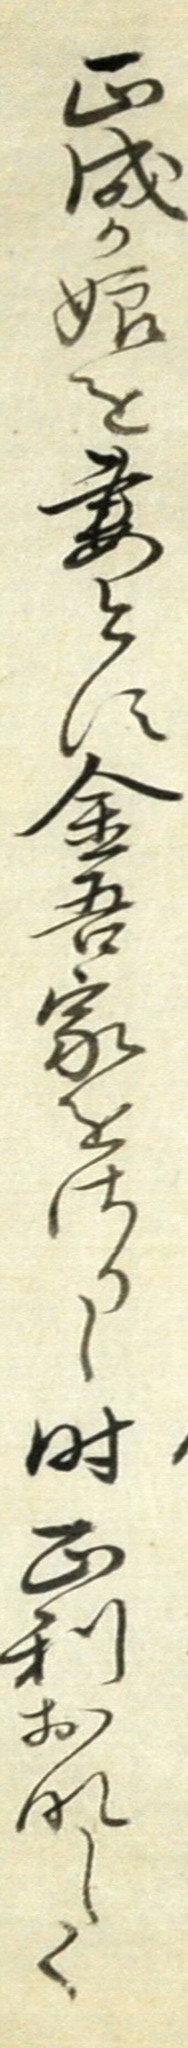正成か娘を妻とす金吾家をさりし時正利おなしく
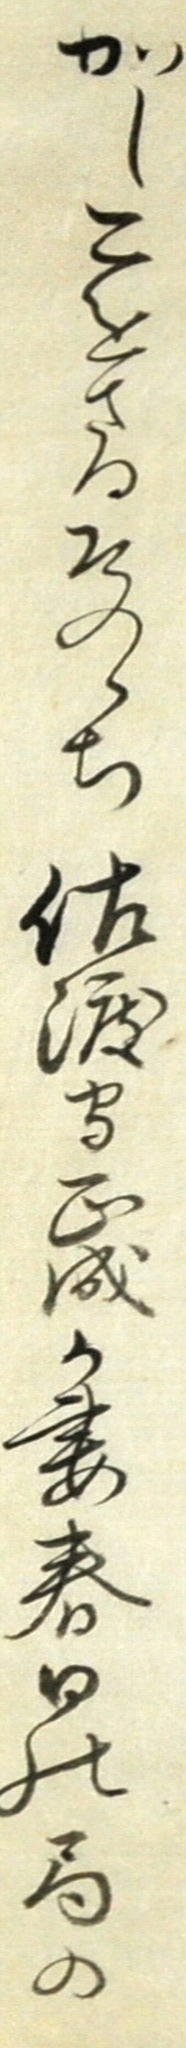かしこをさるそのゝち佐渡守正成か妻春日の局の
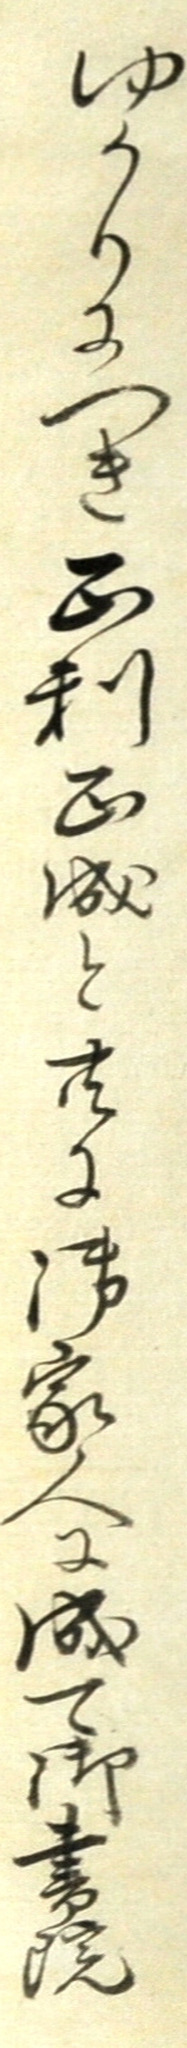ゆかりにつき正利正成と共に御家人に成て御書院

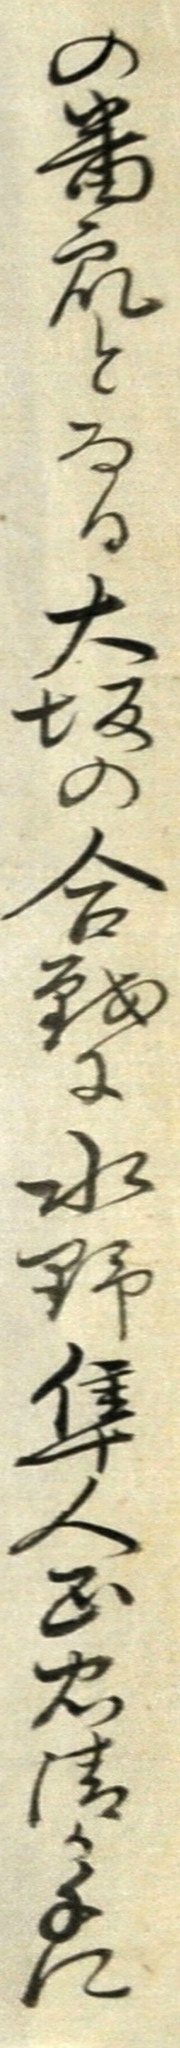の番衆となる大坂の合戦に水野隼人正忠清か手に
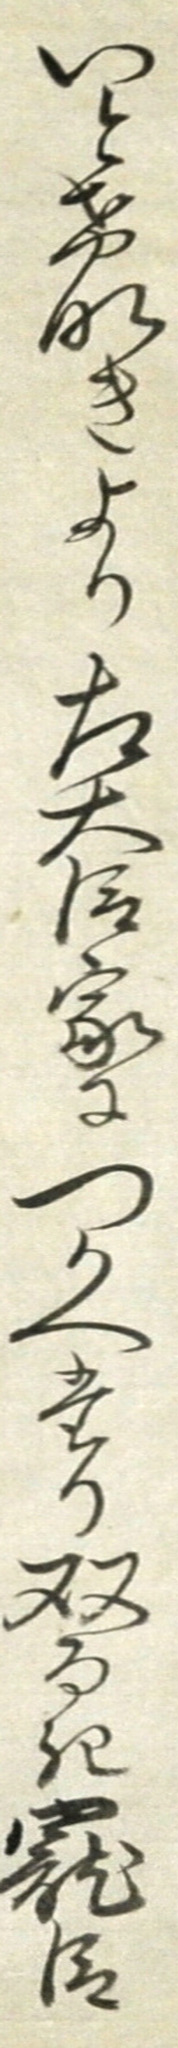いとけなきより左大臣家につかへたり双なき寵臣
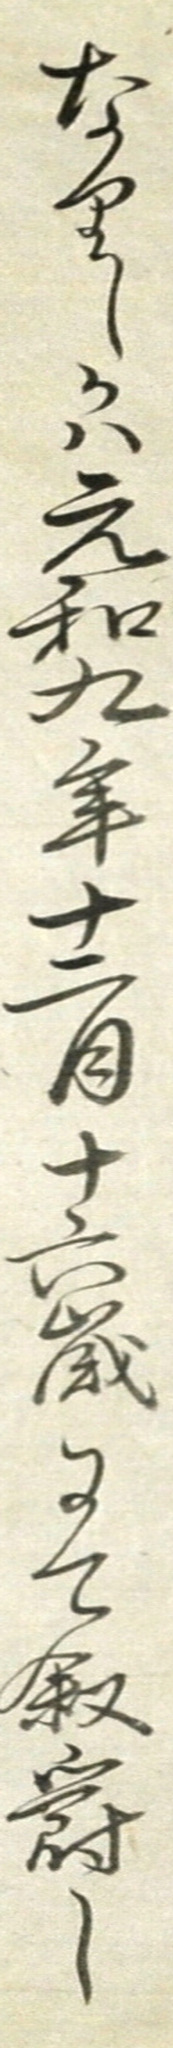なりしかは元和九年十二月十六歳にて叙爵し
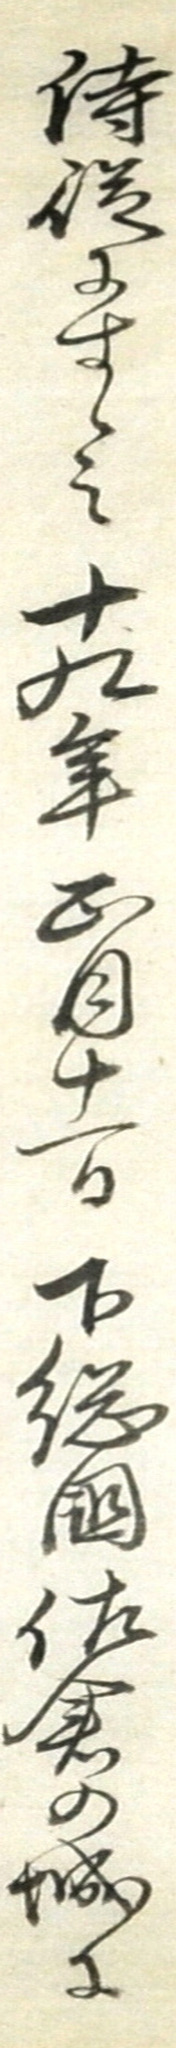侍従にすゝみ十九年正月十一日下総国佐倉の城に
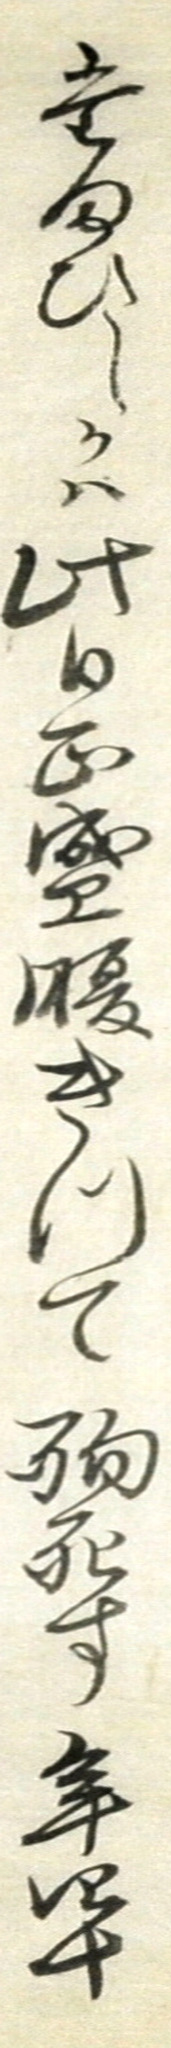たまひしかは此日正盛腹きつて殉死す年四十
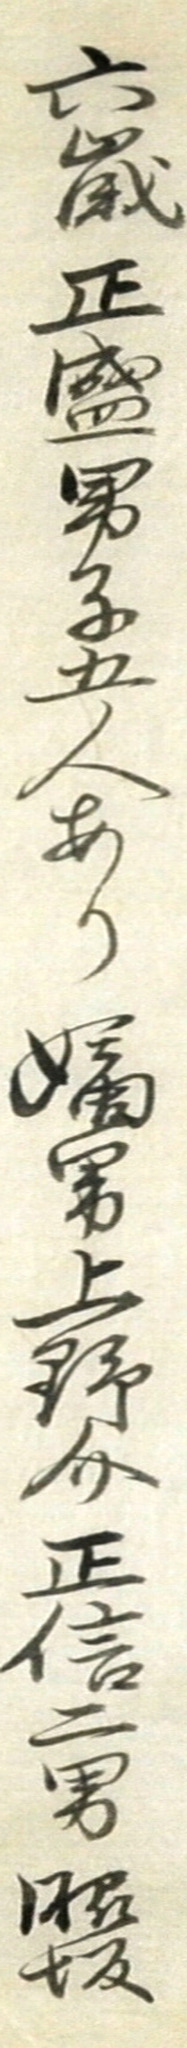六歳正盛男子五人あり嫡男上野介正信二男脇坂
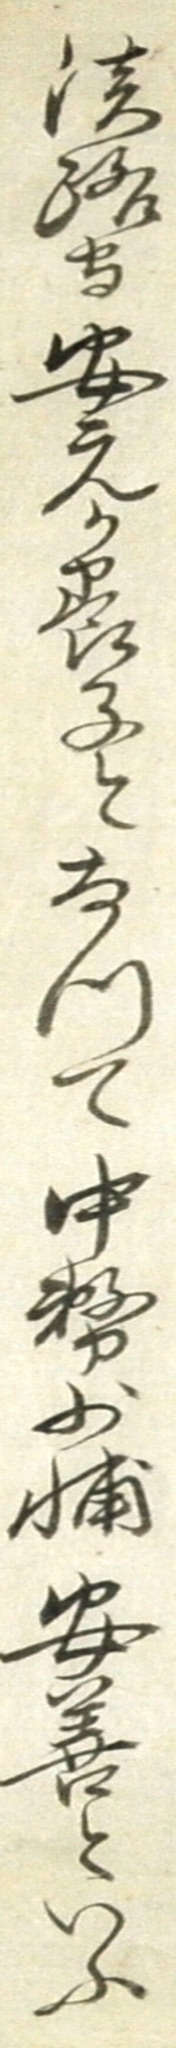淡路守安元か養子となつて中務少輔安善といふ

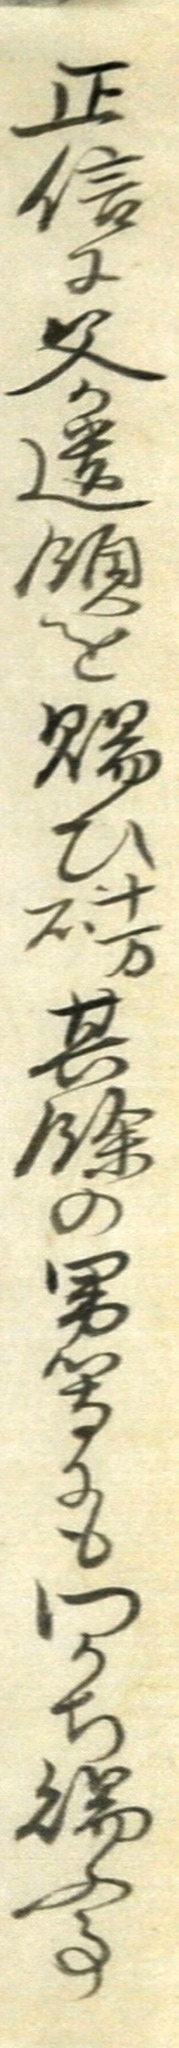正信に父か遺領を賜ひ十万石其余の男等にもわかち賜ふ事
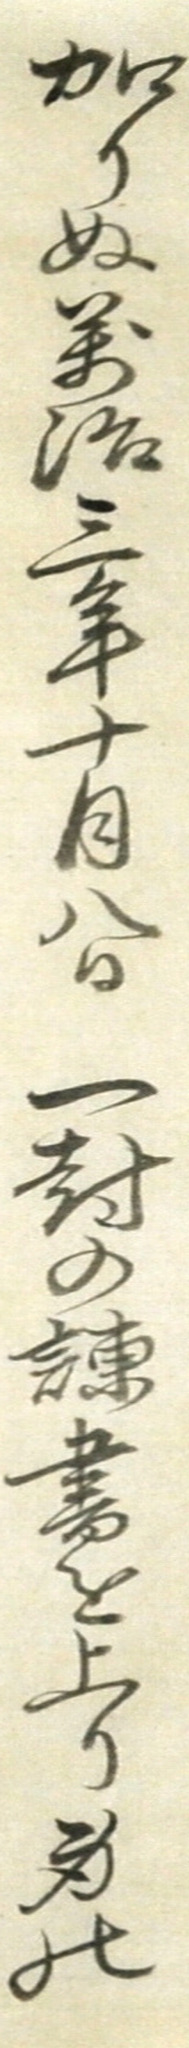加りぬ万治三年十月八日一封の諫書を上り身の
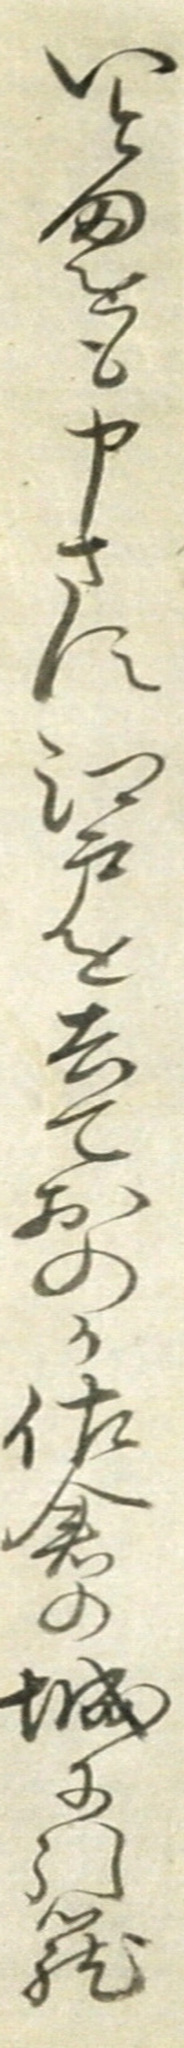いとまをも申さす江戸を去ておのか佐倉の城に引籠
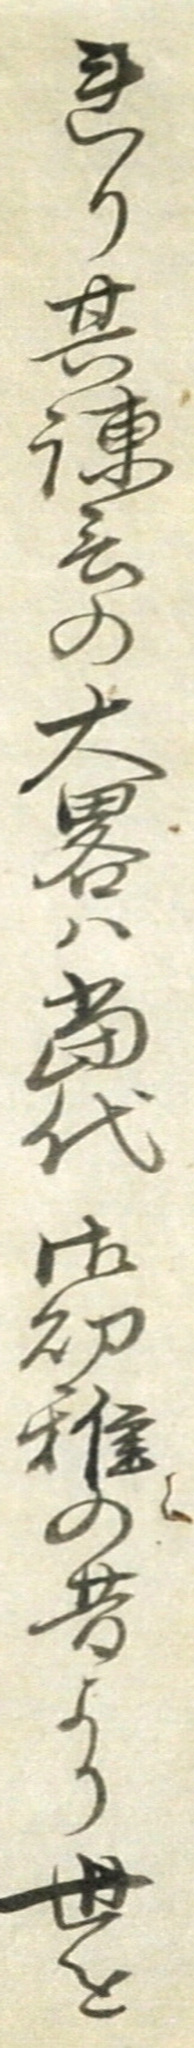れり其諫書の大略は当代御幼稚の昔より世を
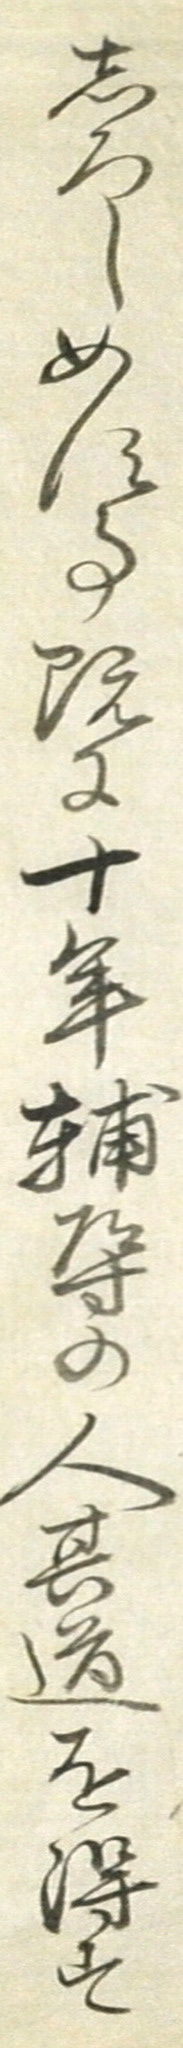しろしめす事既に十年輔導の人其道を得す
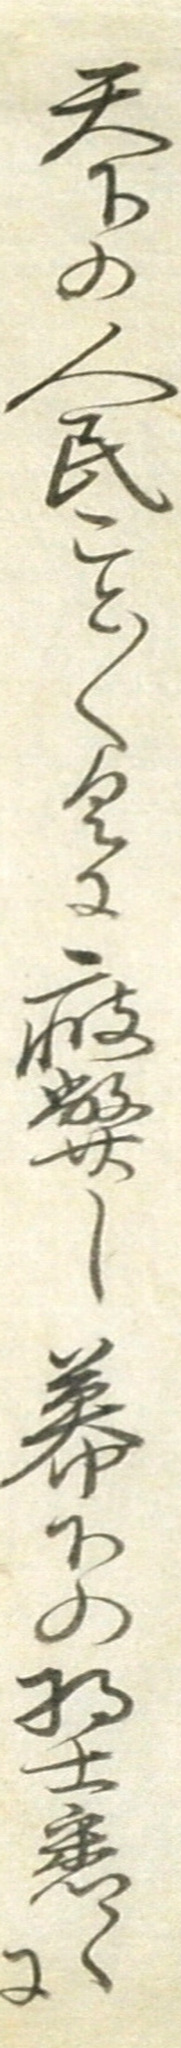天下の人民こと〳〵くに疲弊し幕下の将士悉くに
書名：藩翰譜（六）
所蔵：伊那市立高遠町図書館・合同会社AMANE
